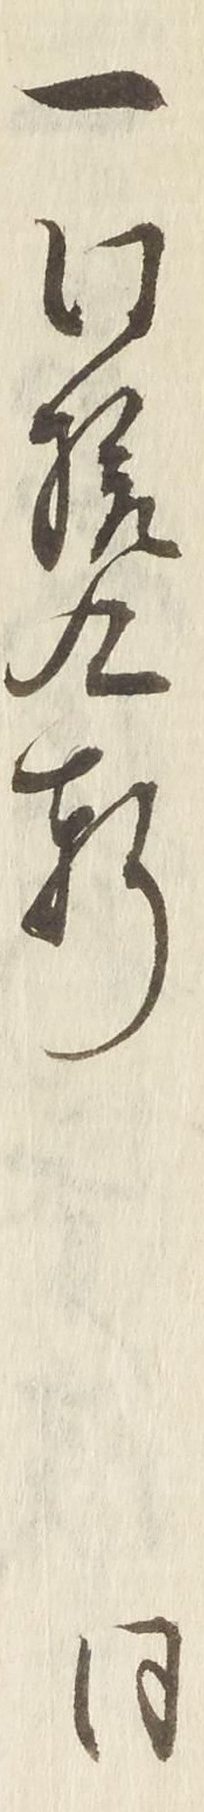一同拾九軒同
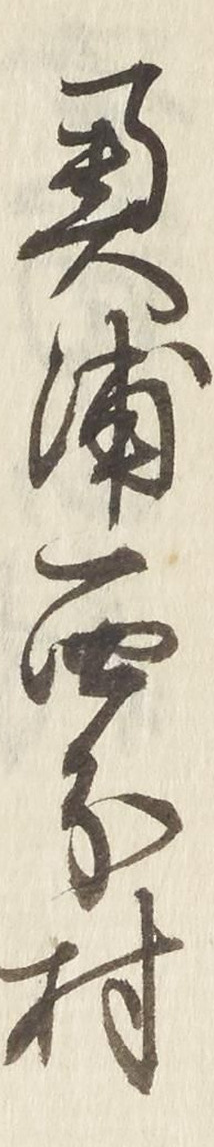奥浦西分村
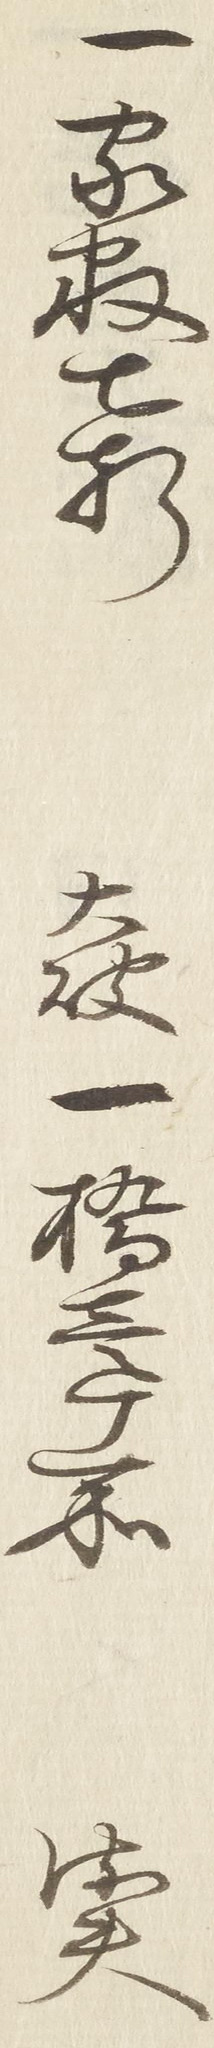一家数七軒大破一橋一ヶ所流失
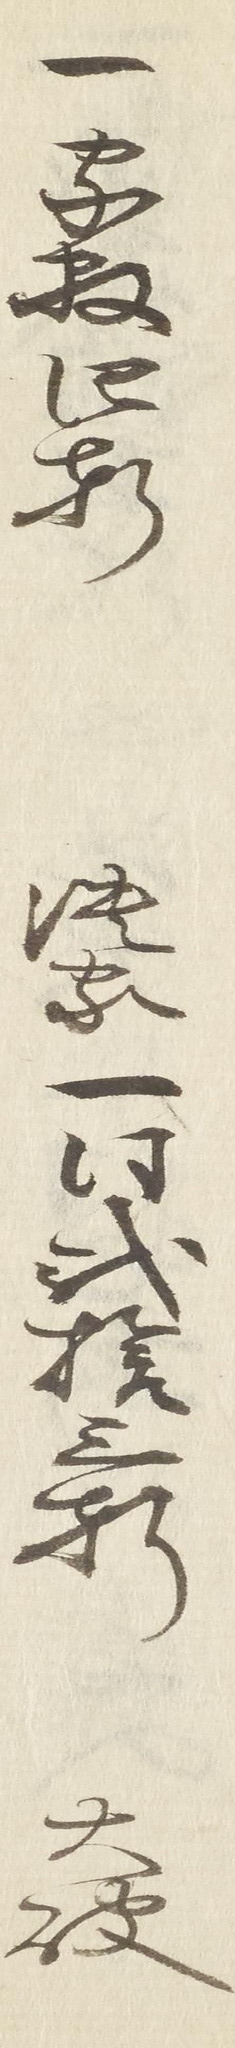一家数四軒潰家一同弐拾三軒大破
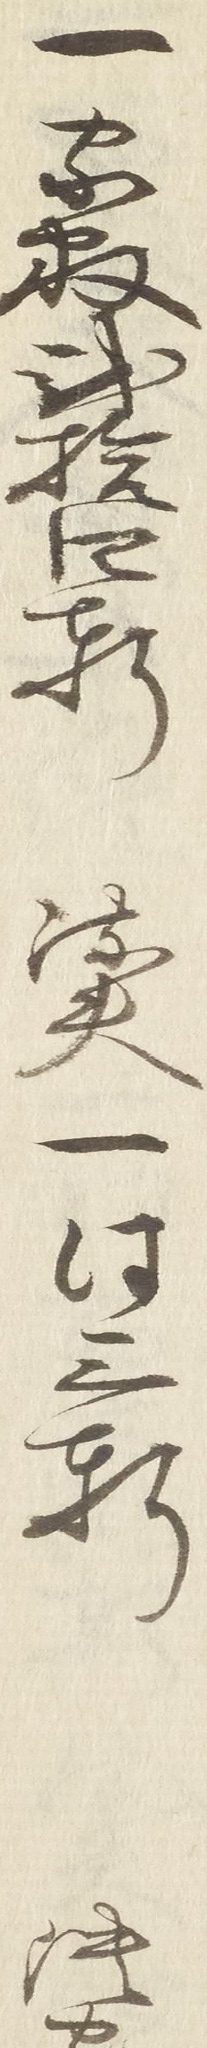一家数弐拾四軒流失一同三軒潰家
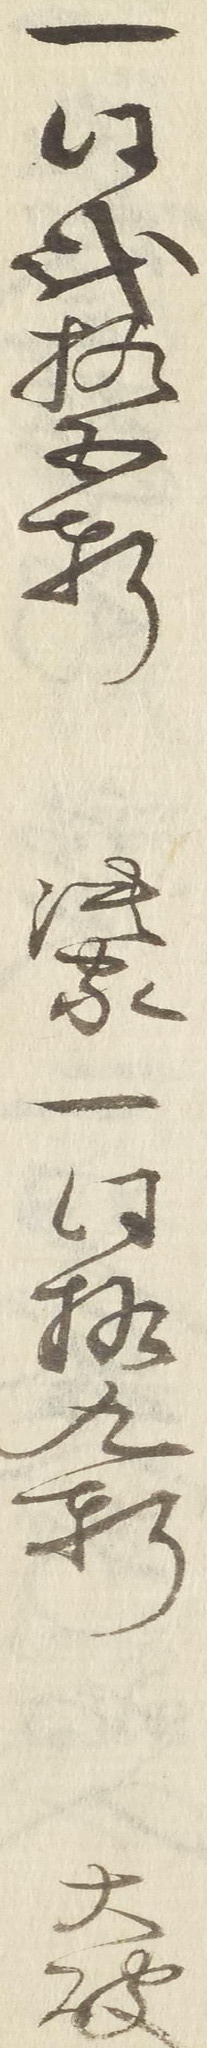一同弐拾五軒潰家一同拾九軒大破

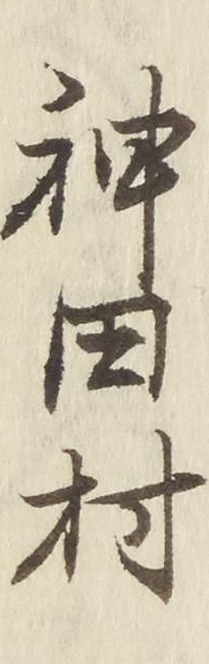神田村
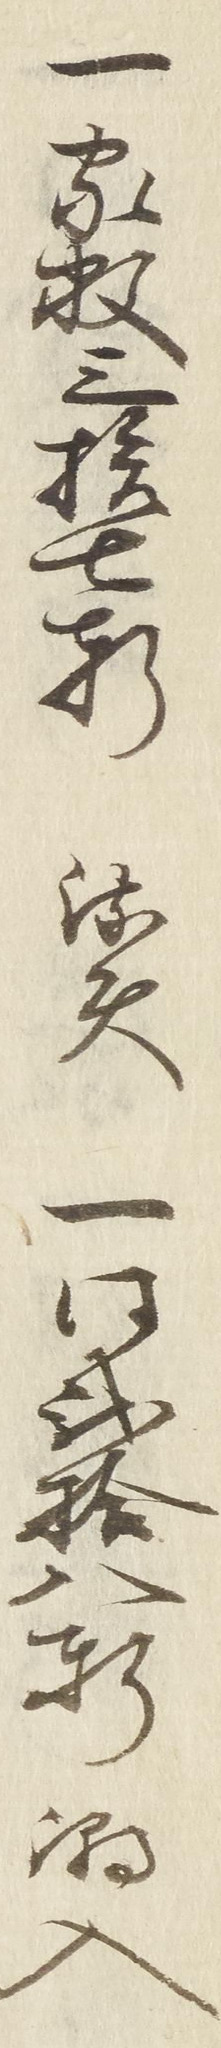一家数三拾七軒流失一同弐拾八軒潮入
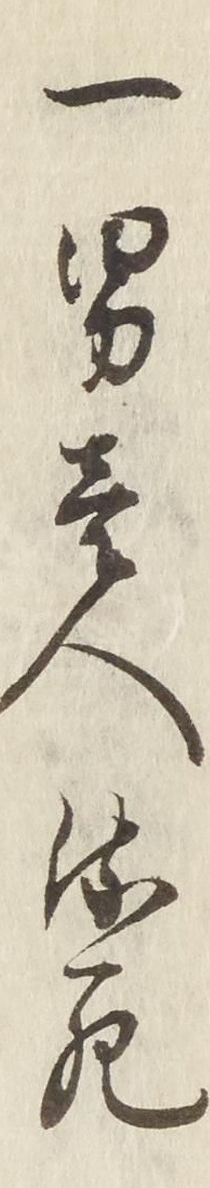一男壱人流死
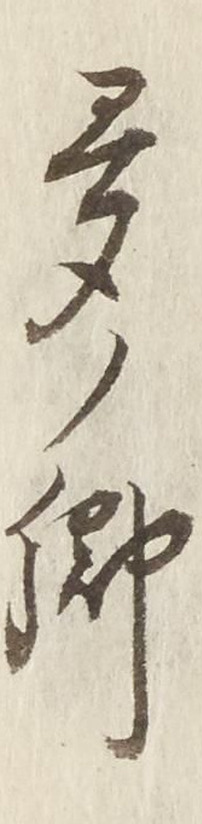多ノ郷
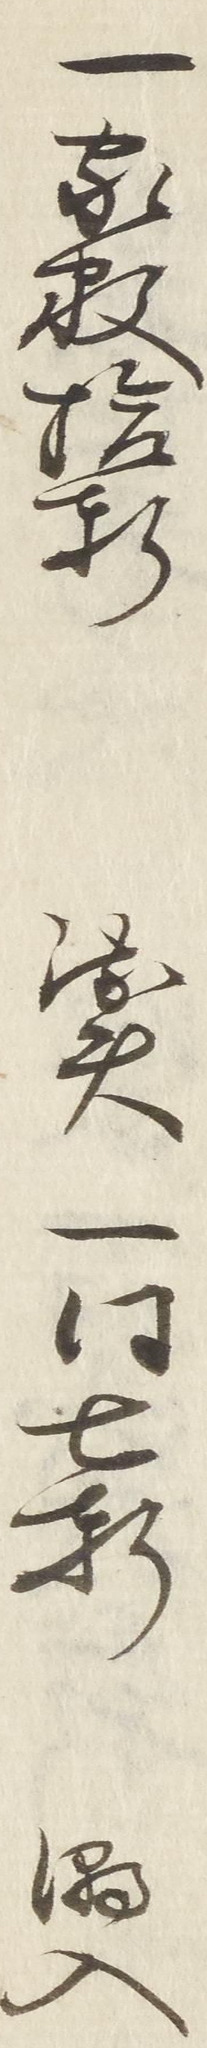一家数拾軒流失一同七軒潮入
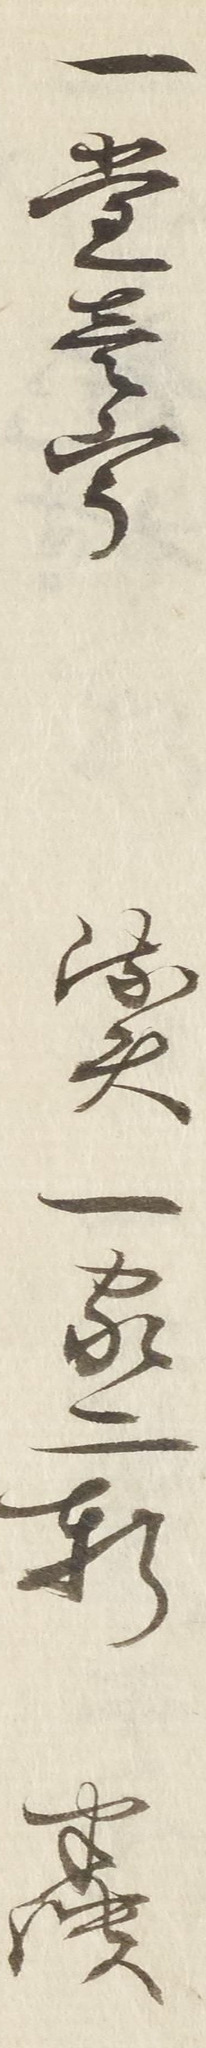一堂壱宇流失一家二軒半潰
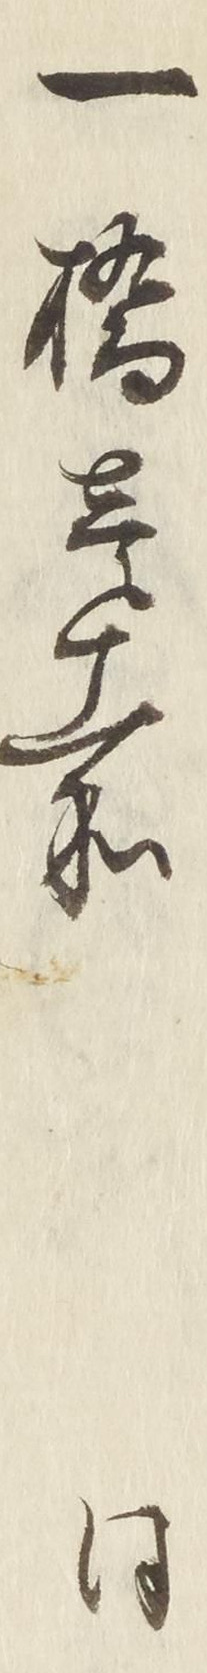一橋壱ヶ所堂
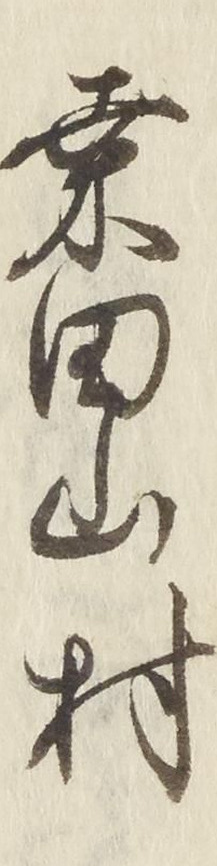桑田山村
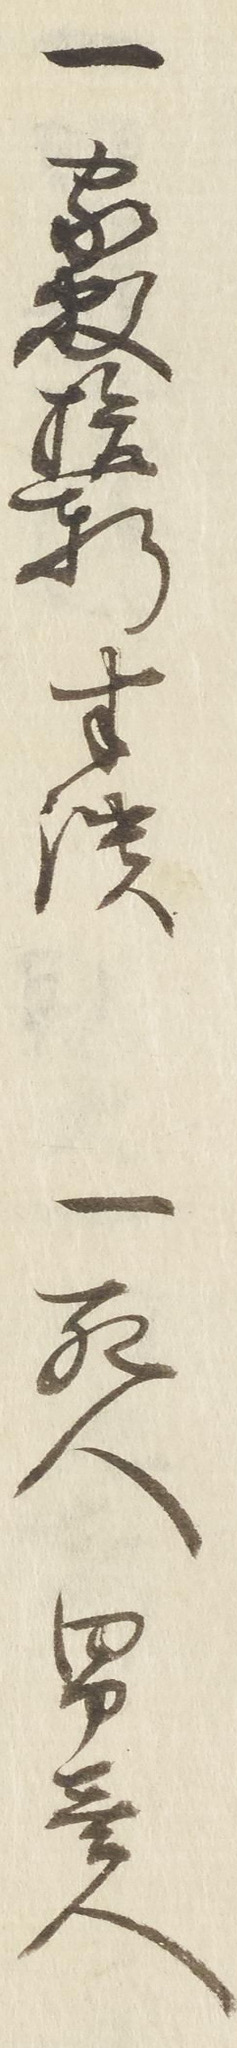一家数拾軒半潰一死人男壱人
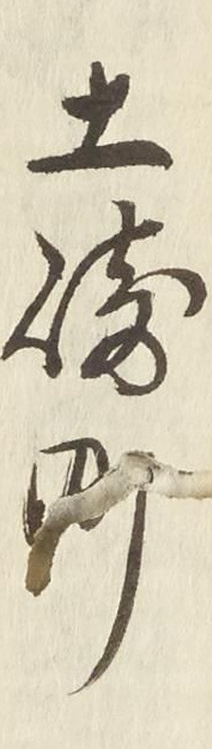土崎町
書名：地震記　下
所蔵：東京大学地震研究所図書室 Earthquake Research Institute Library, The University of Tokyo, JAPAN
